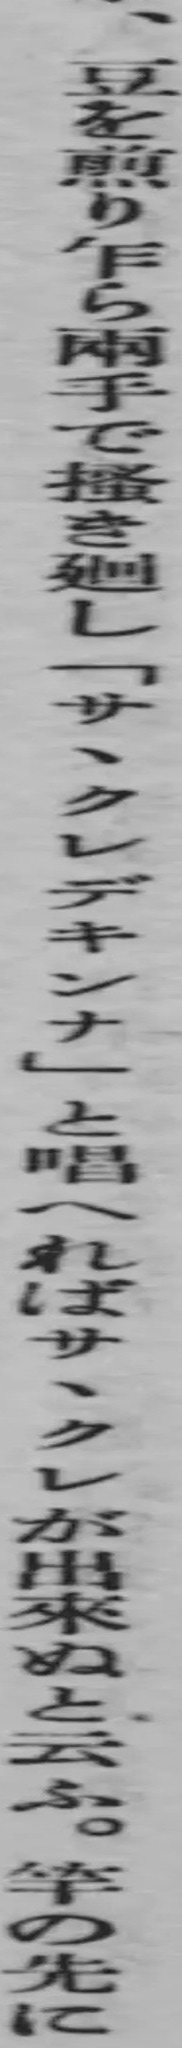ホ、豆を煎り乍ら兩手で掻き廻し「サヽクレデキンナ」と唱へればサヽクレが出來ぬと云ふ。竿の先に
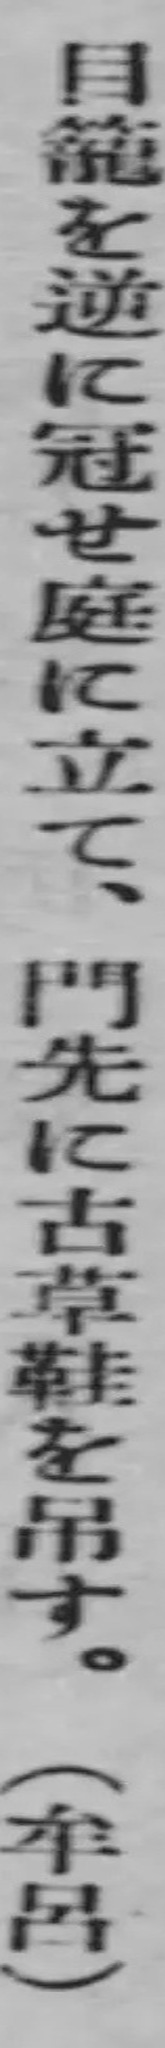目籠を逆に冠せ庭に立て、門先に古草鞋を吊す。(牟呂)
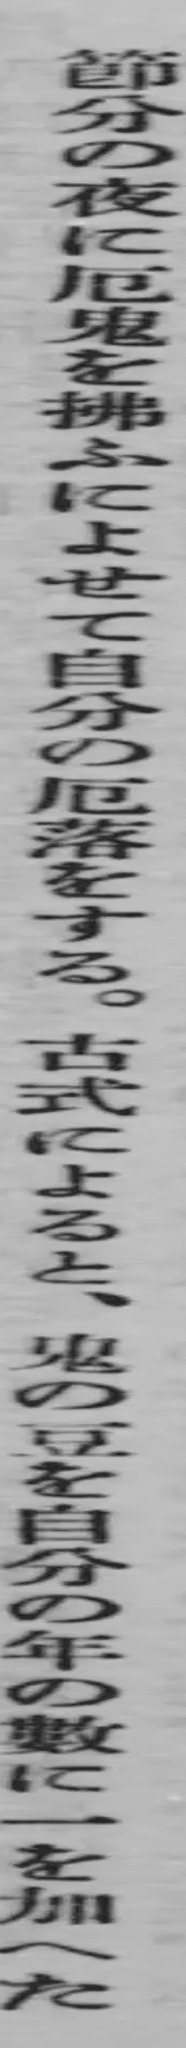節分の夜に厄鬼を拂ふによせて自分の厄落をする。古式によると、鬼の豆を自分の年の數に一を加へた
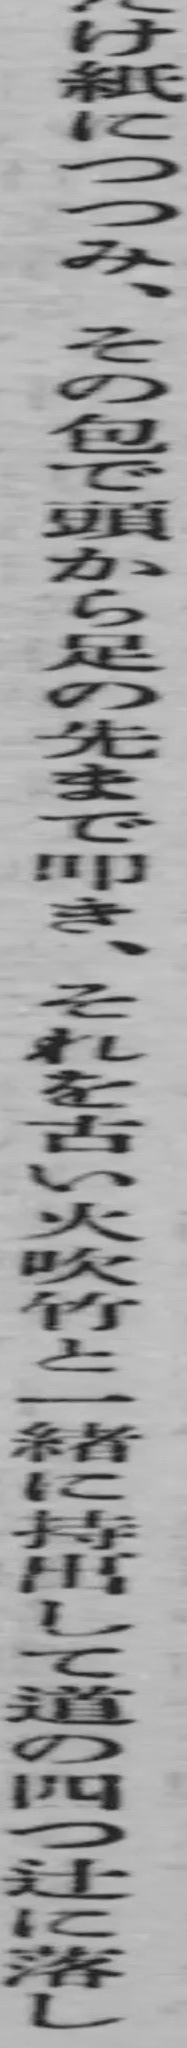だけ紙につつみ、その包で頭から足の先まで叩き、それを古い火吹竹と一緒に持出して道の四つ辻に落し
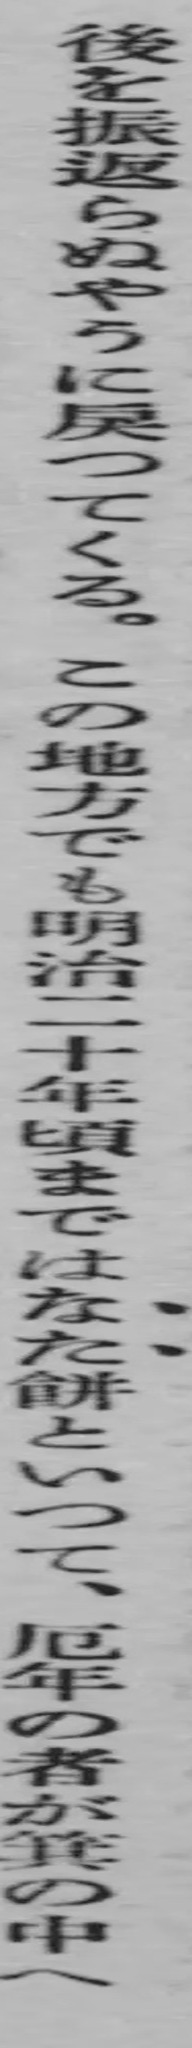後を振返らぬやうに戻つてくる。この地方でも明治二十年頃まではなた餅といつて、厄年の者が箕の中へ
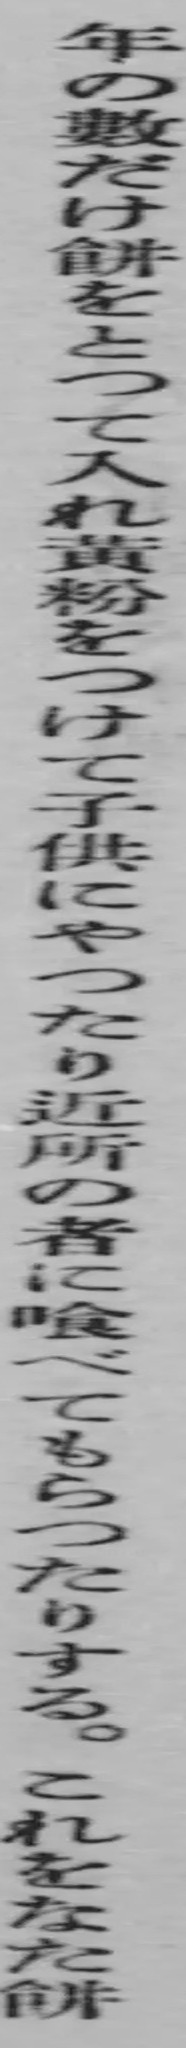年の數だけ餅をとつて入れ黄粉をつけて子供にやつたり近所の者に喰べてもらつたりする。これをなた餅
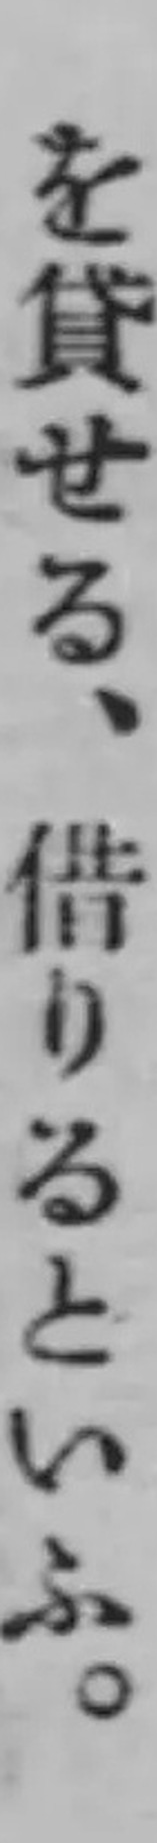を貸せる、借りるといふ。
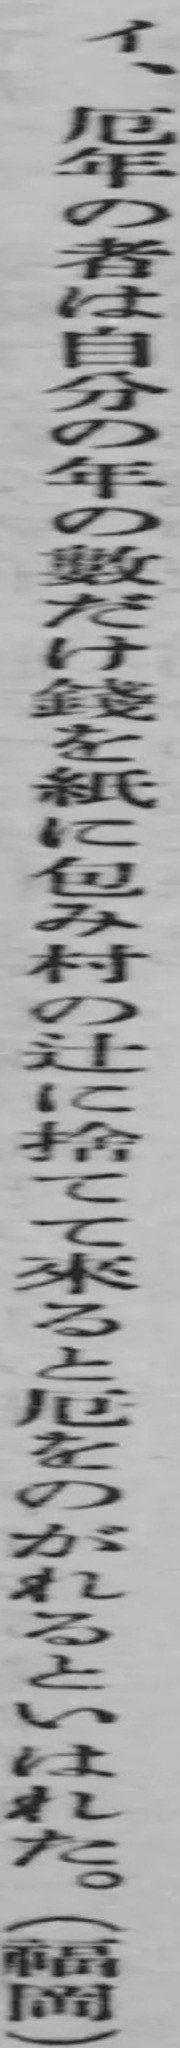イ、厄年の者は自分の年の数だけ錢を紙に包み村の辻に捨てて來ると厄をのがれるといはれた。(福岡)
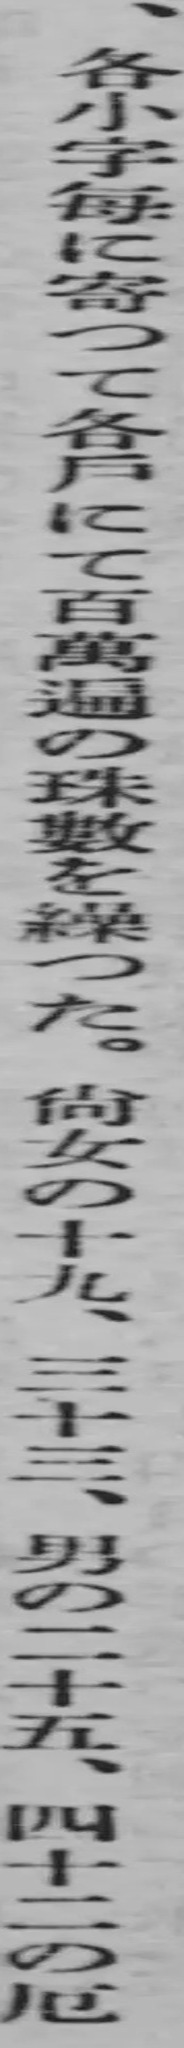ロ、各小字每に寄つて各戸にて百萬遍の珠數を繰つた。尚女の十九、三十三、男の二十五、四十二の厄
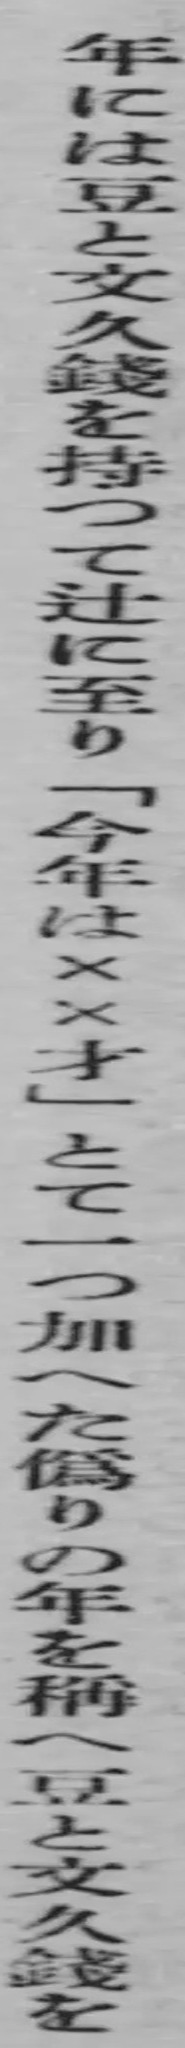年には豆と文久錢を持つて辻に至り「今年は××才」とて一つ加へた僞りの年を稱へ豆と文久錢を
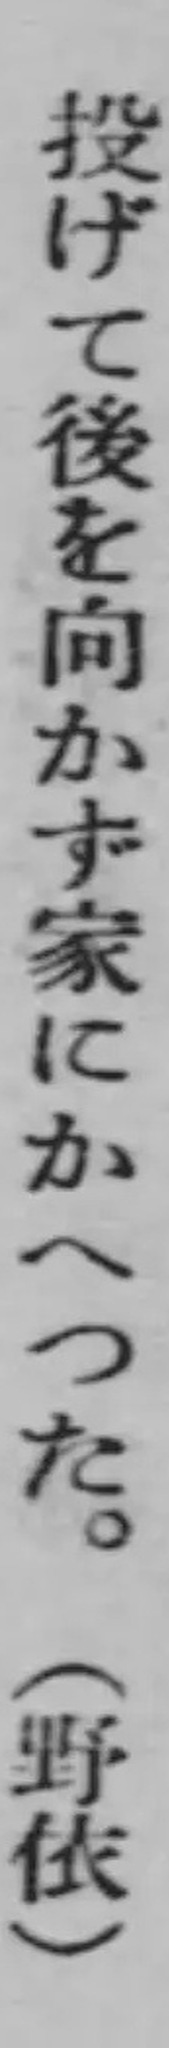投げて後を向かず家にかへつた。(野依)

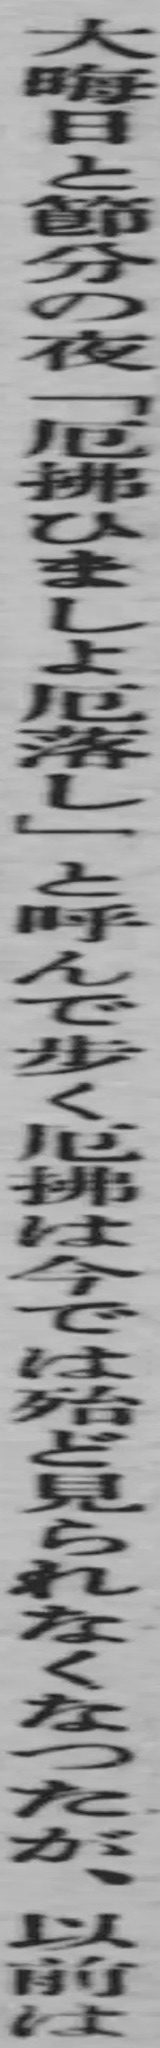大晦日と節分の夜「厄拂ひましよ厄落し」と呼んで歩く厄拂は今では殆どみられなくかつたが、以前は
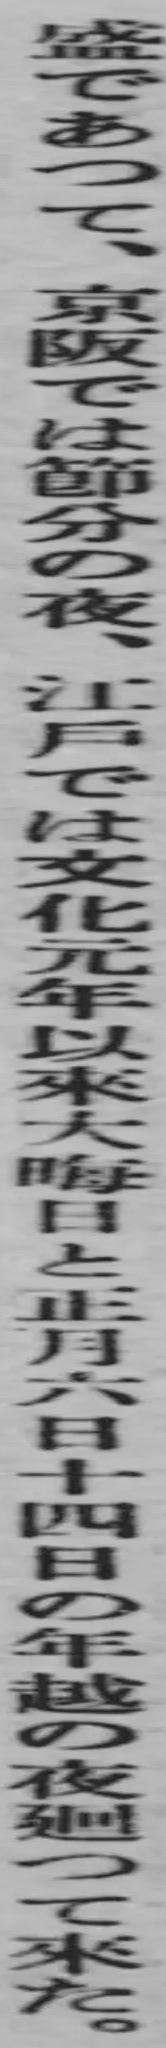盛であつて、京阪では節分の夜、江戸では文化元年以來大晦日と正月六日十四日の年越の夜廻つて來た。
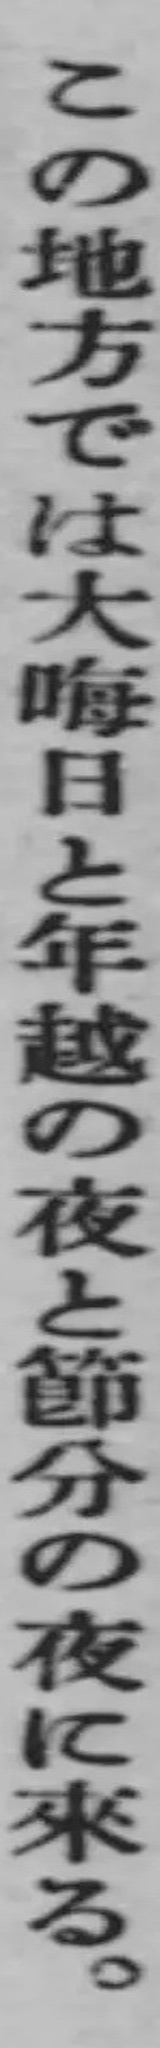この地方では大晦日と年越の夜と節分の夜に來る。
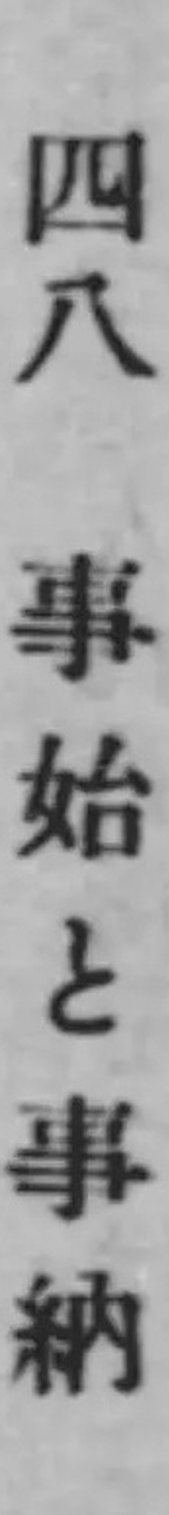四八事始と事納
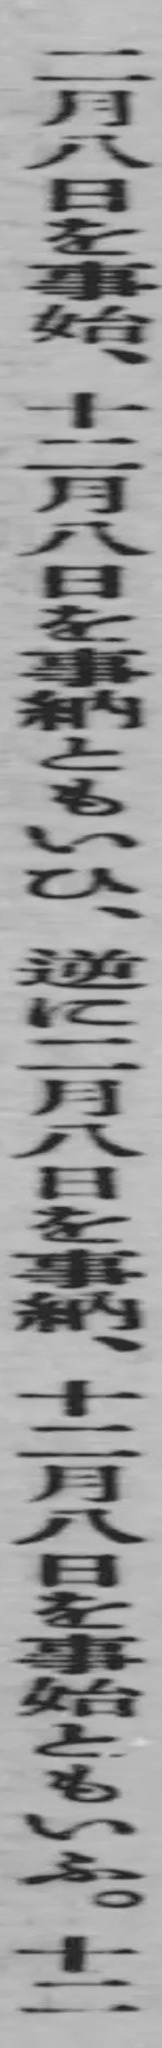二月八日を事始、十二月八日を事納ともいひ、逆に二月八日を事納、十二月八日を事始ともいふ。十二
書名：豊橋の年中行事
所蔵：国立国会図書館 National Diet Library, JAPAN
